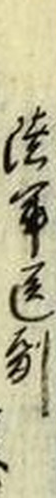陸軍医副
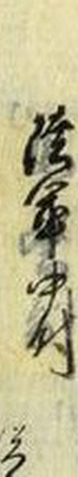陸軍中尉

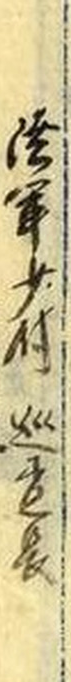陸軍少尉巡査長
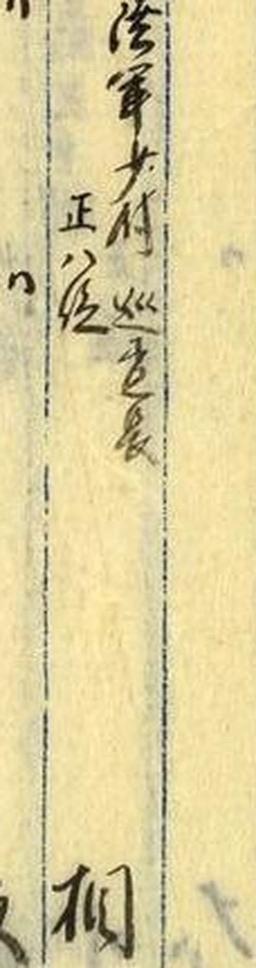陸軍少尉巡査長
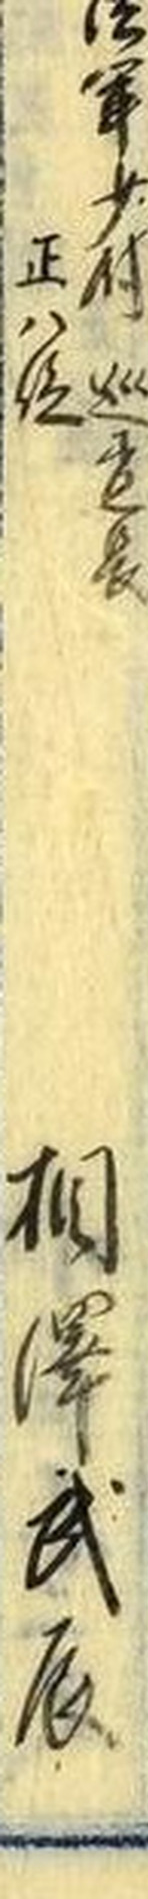正八位相沢武辰
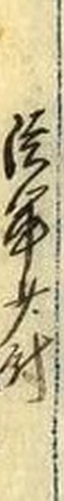陸軍少尉
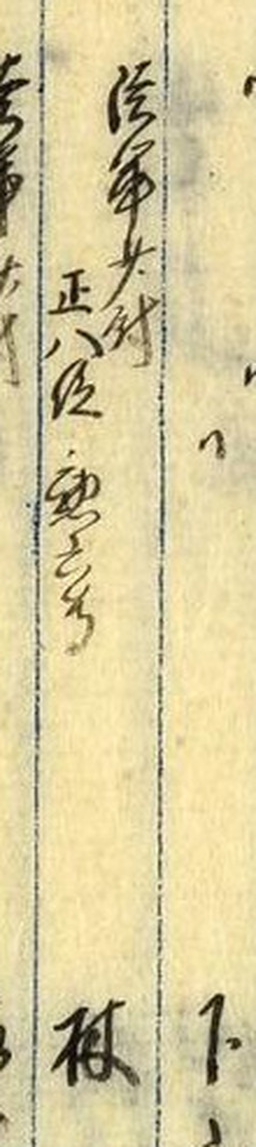陸軍少尉
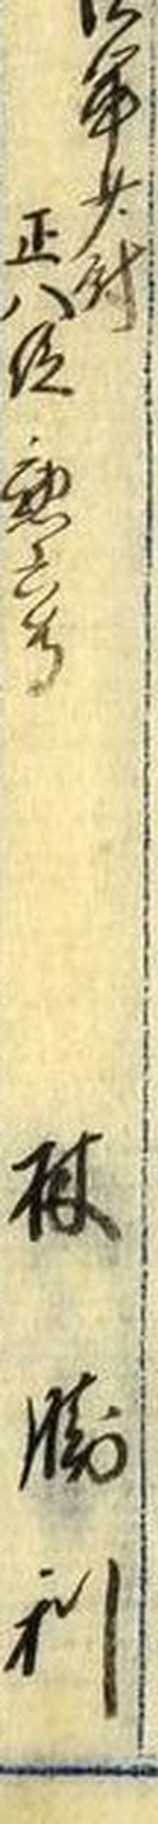正八位勲六等林勝利
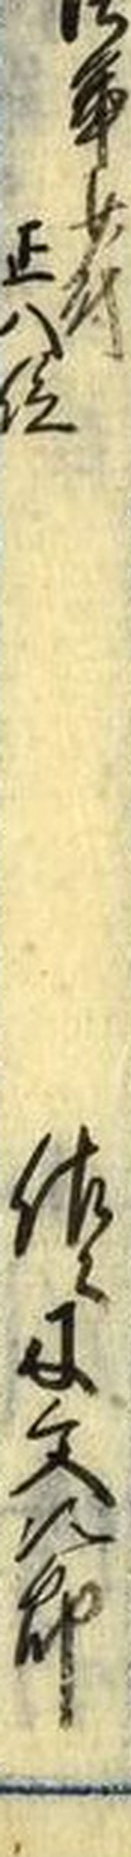正八位佐々木文次郎

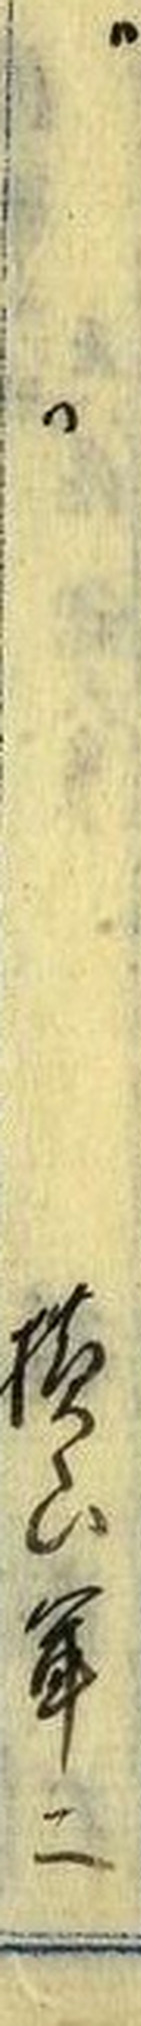同横山軍二
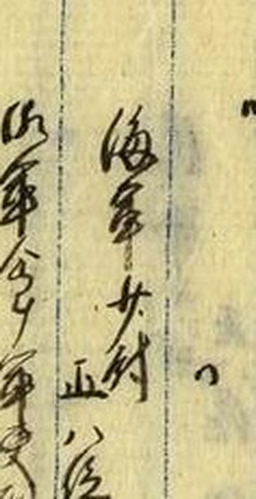海軍少尉
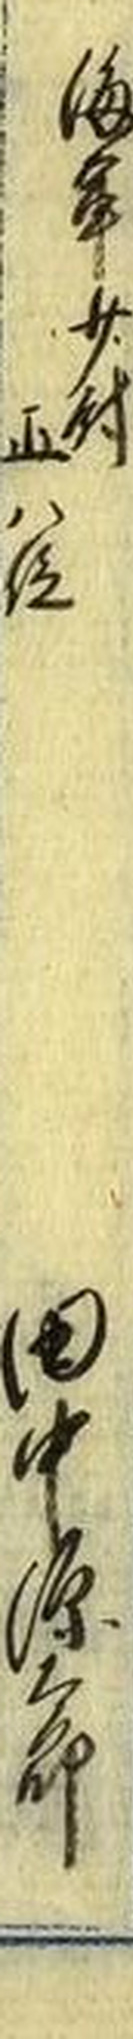正八位田中源太郎
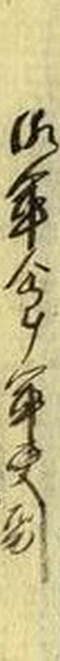陸軍会計軍吏副
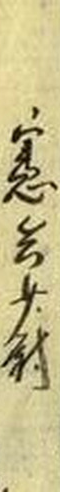憲兵少尉
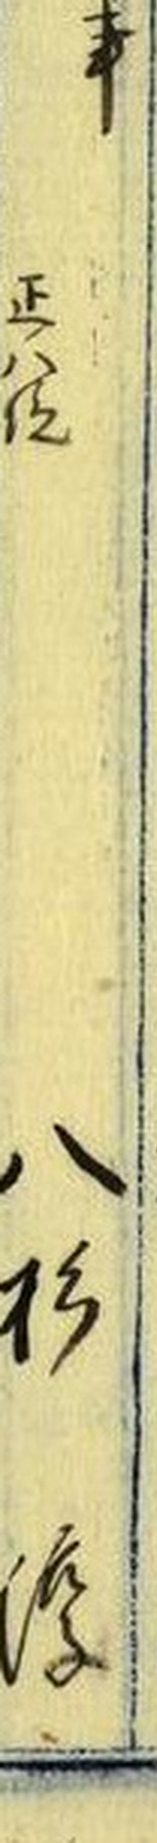正八位八杉淳
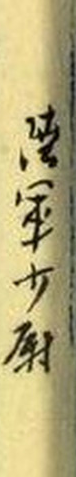陸軍少尉
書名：温古集 三巻
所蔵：福井県文書館 Fukui Prefectural Archives
